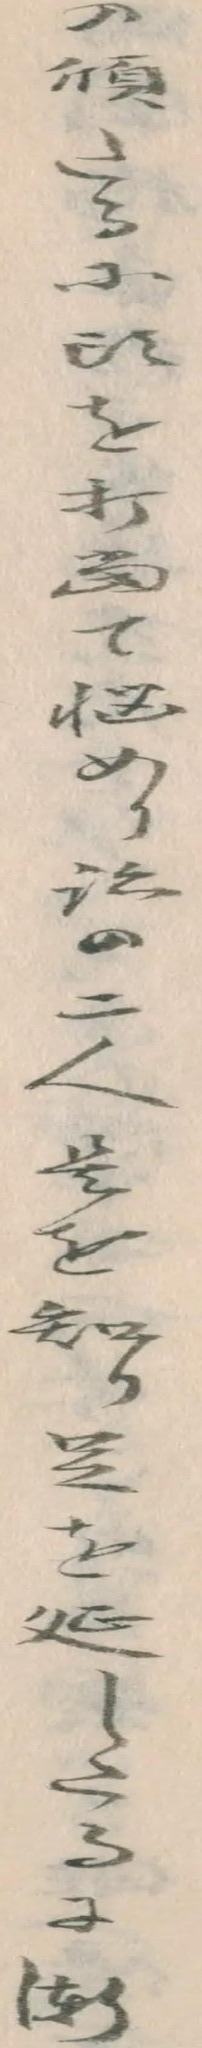の傾たるに頭を打当て悩めり跡の二人是を知り足を延したるに漸
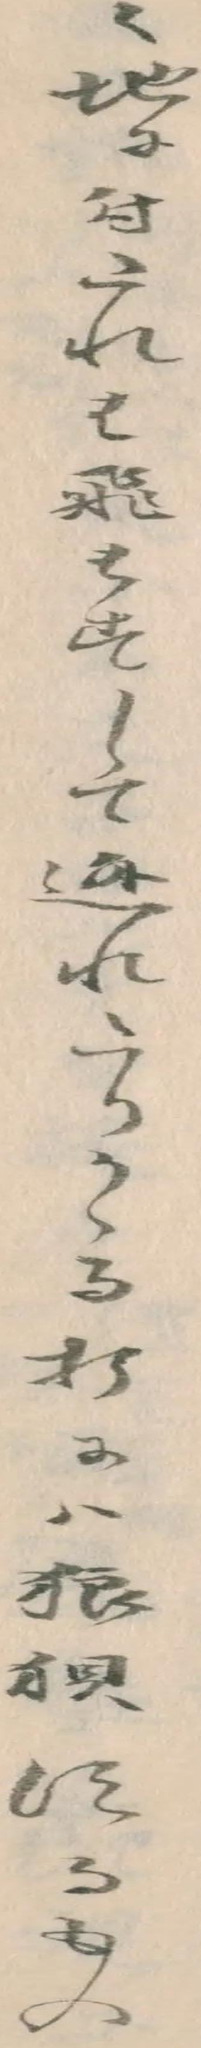く地に付たれは飛はすして逃れたりかゝる折には狼狽するもの

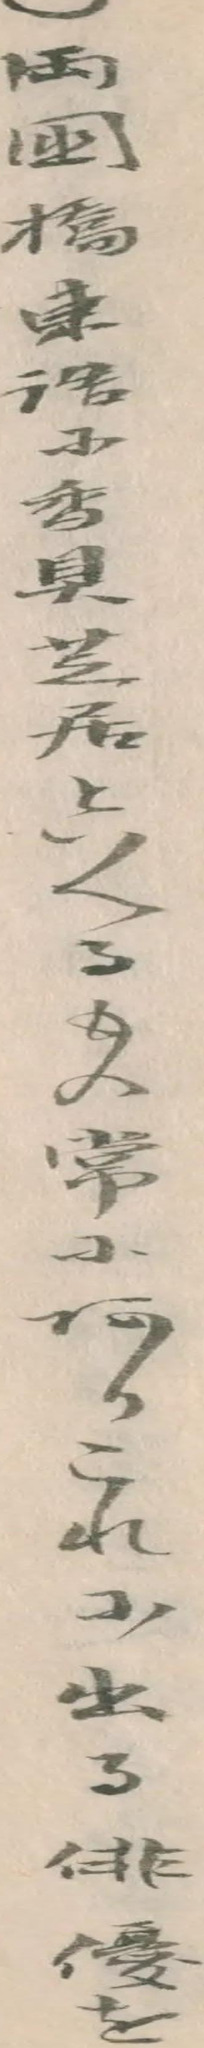〇両国橋東詰に香具芝居といへるもの常にありこれに出る俳優を
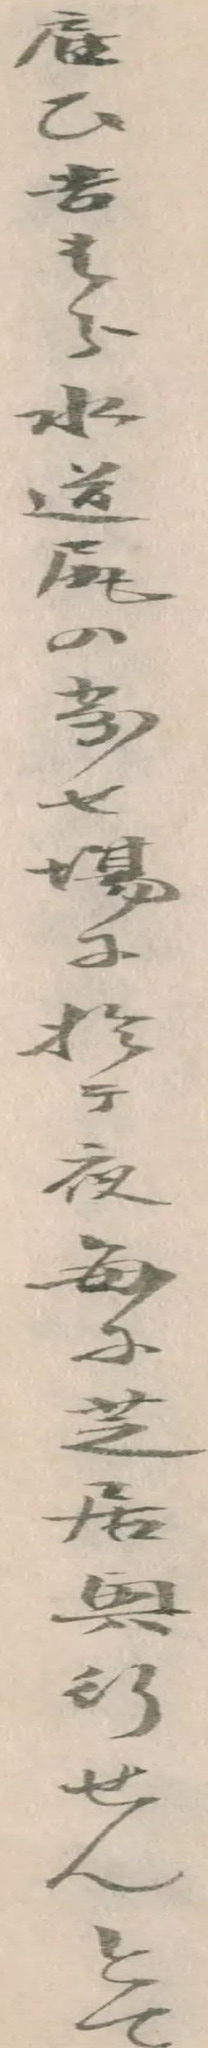雇ひ吉はら水道尻の寄せ場に於て夜毎に芝居興行せんとて
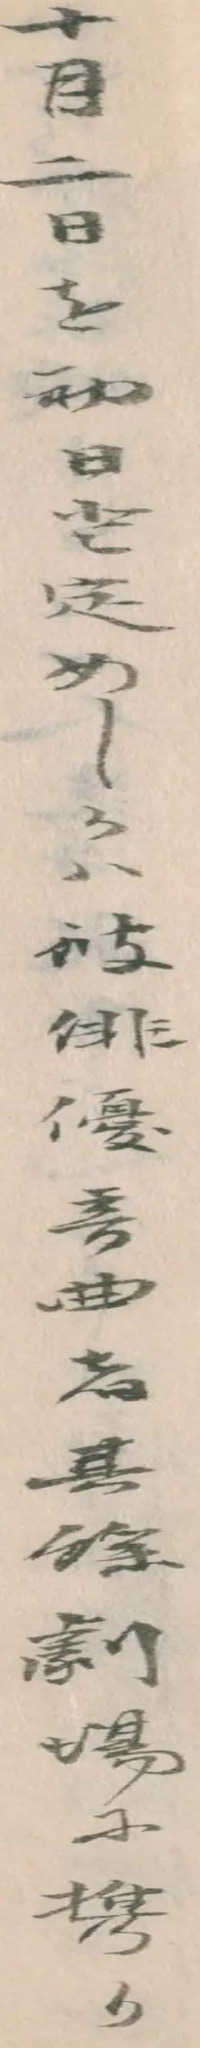十月二日を初日と定めしかは彼俳優音曲者其余劇場に携り
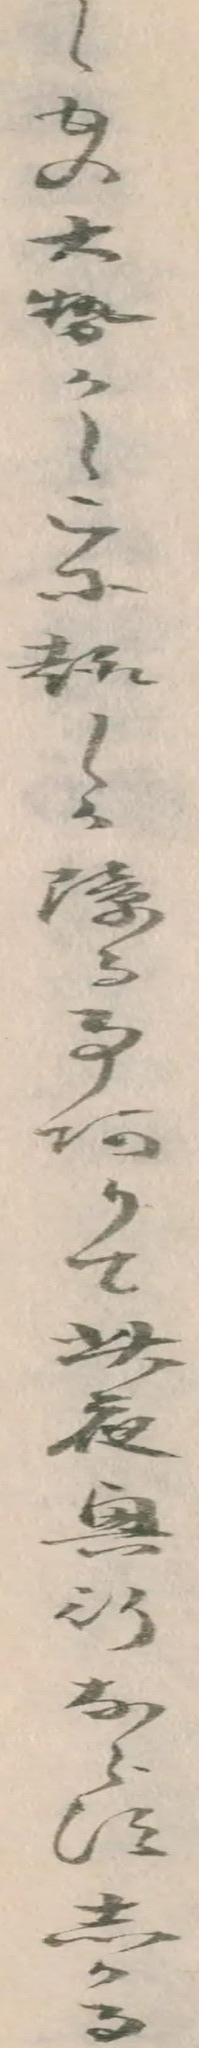しもの大勢かしこに趣しか障る事ありて此夜興行ならすしかる
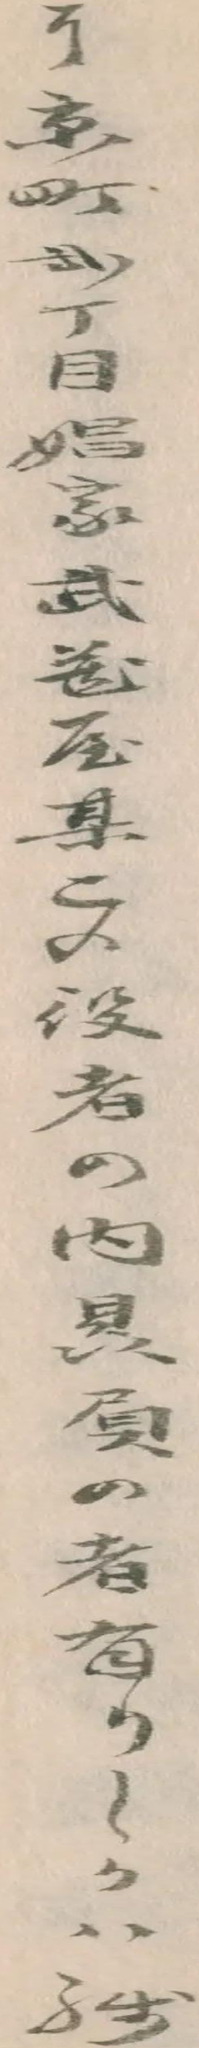に京町弐丁目娼家武蔵屋某この役者の内贔屓の者有りしかは残
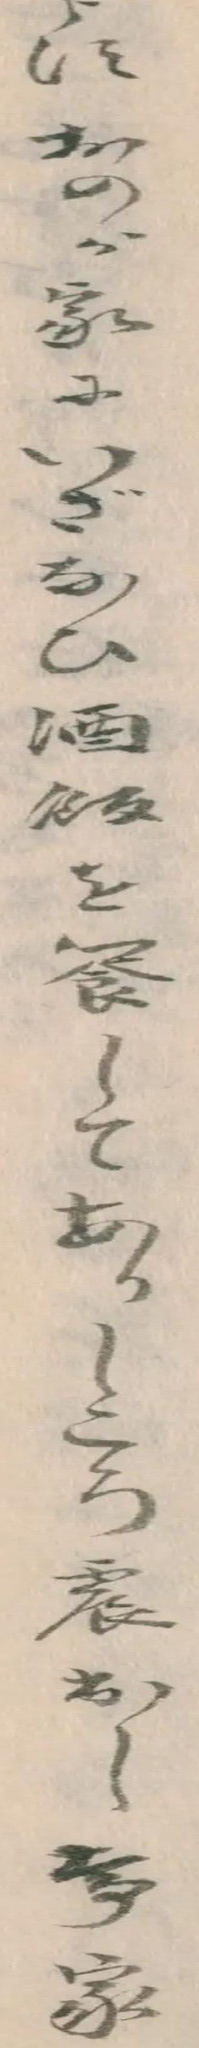らすおのが家にいざなひ酒飯を饗してありしころ震出して家
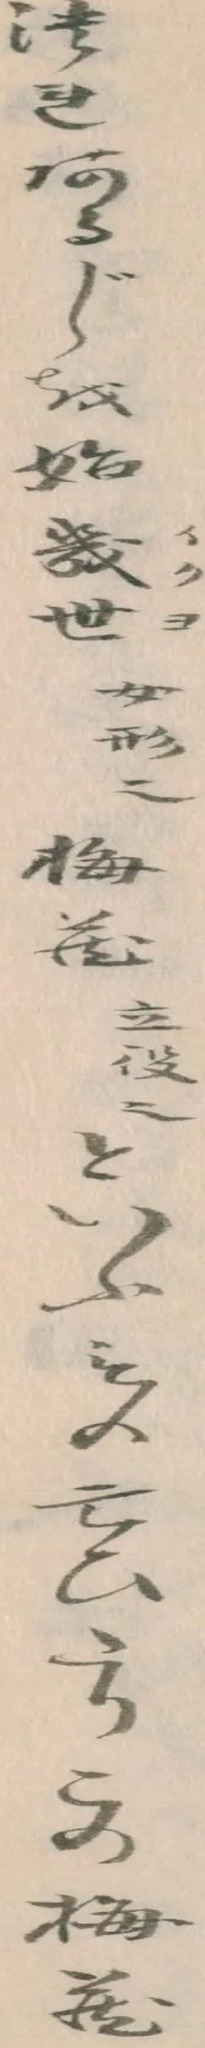潰れあるじを始幾世女形也梅蔵立役也といふもの亡ひたりこの梅蔵
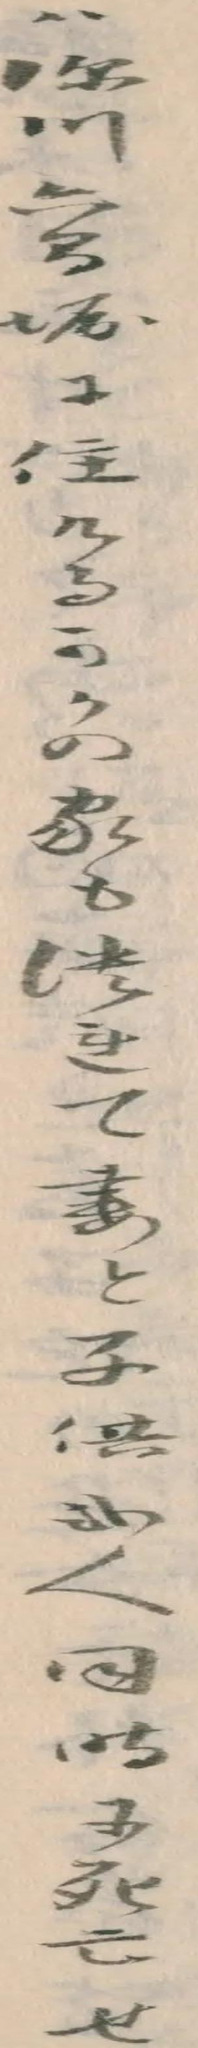は深川六間堀に住けるかかの家も潰れて妻と子供弐人同時に死亡せ
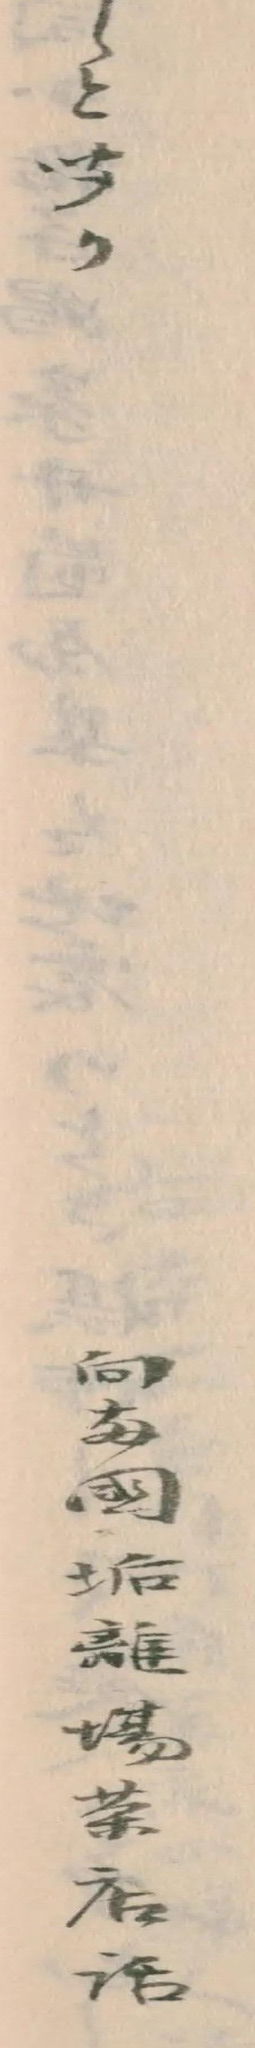しと聞り向両国垢離場茶店話
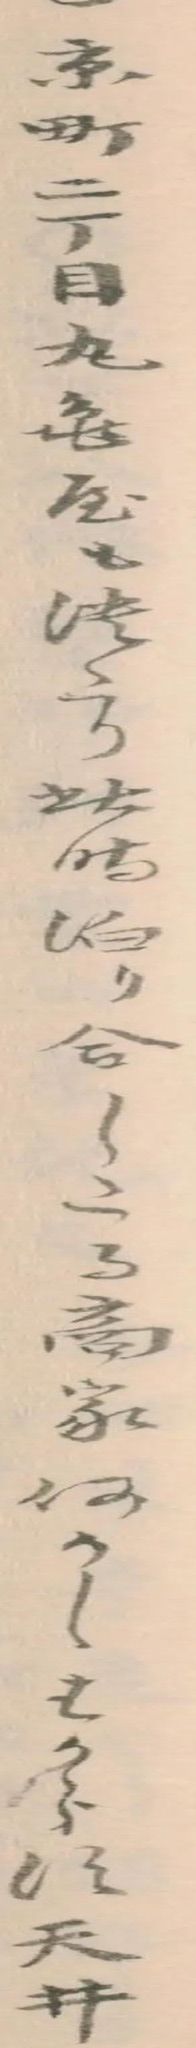〇京町二丁目丸亀屋も潰たり此時泊り合したる商家ありしはからす天井
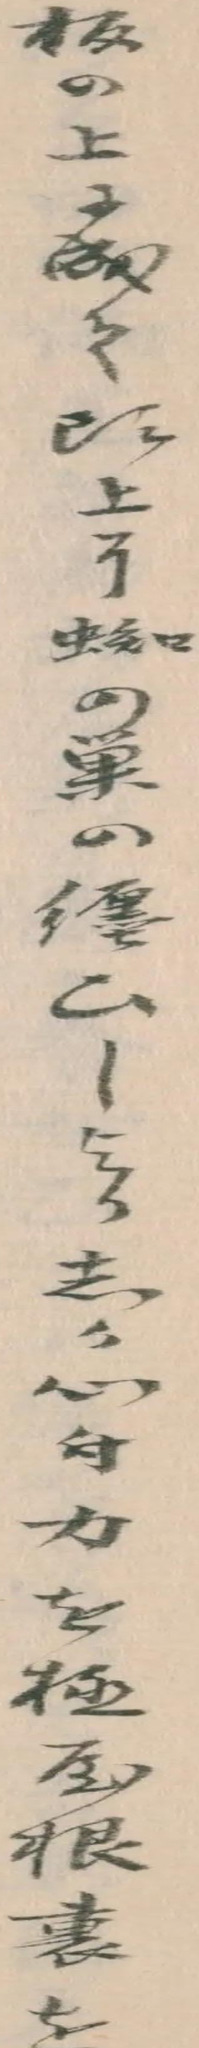板の上に成て頭上に蜘の巣の纏ひしよりしか心付力を極屋根裏を
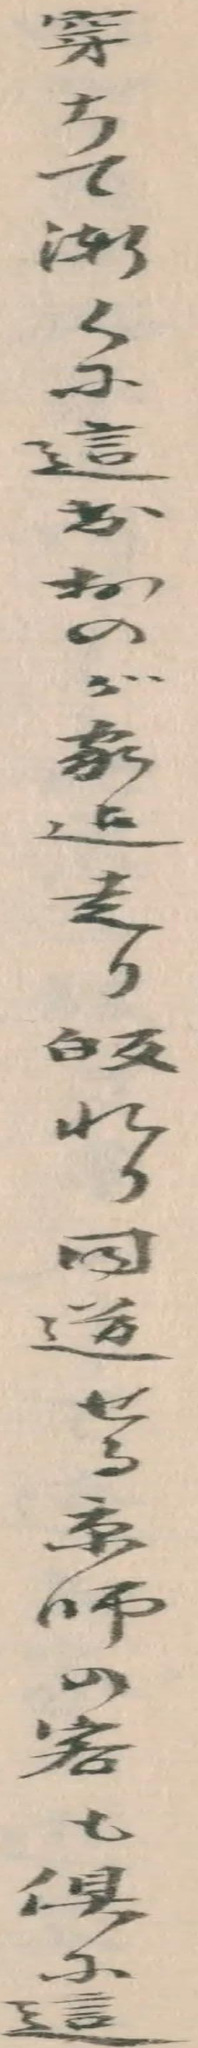穿ちて漸くに這出おのが家迄走り帰れり同道せる京師の客も倶に這
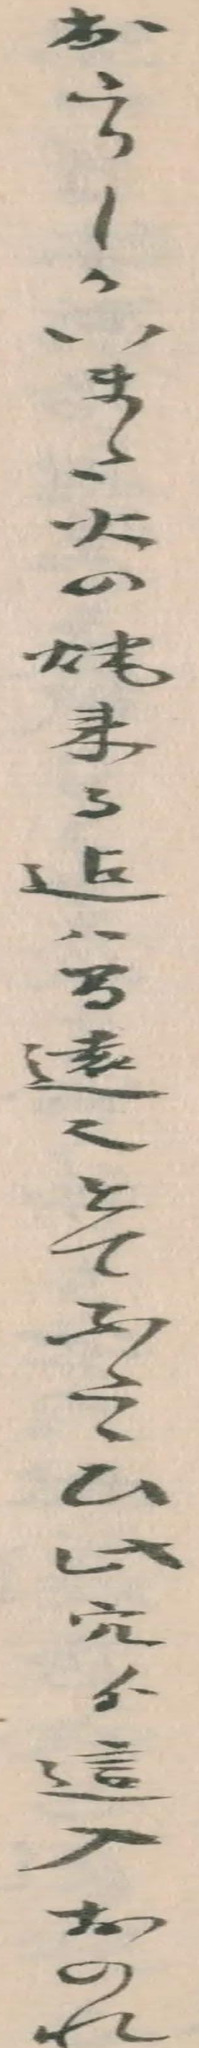出たりしかいまた火の焼来る迄は間遠也とてふたゝひ此穴ゟ這入おのれ
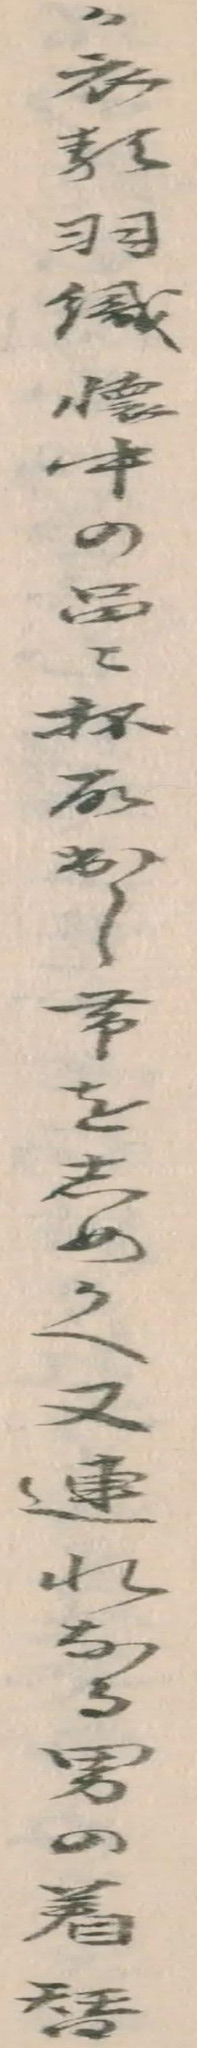か衣類羽織懐中の品々抔取出し帯をしめかへ又連れなる男の着替
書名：地災撮要. 巻10(地震之部) 上,下
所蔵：国立国会図書館 National Diet Library, JAPAN
